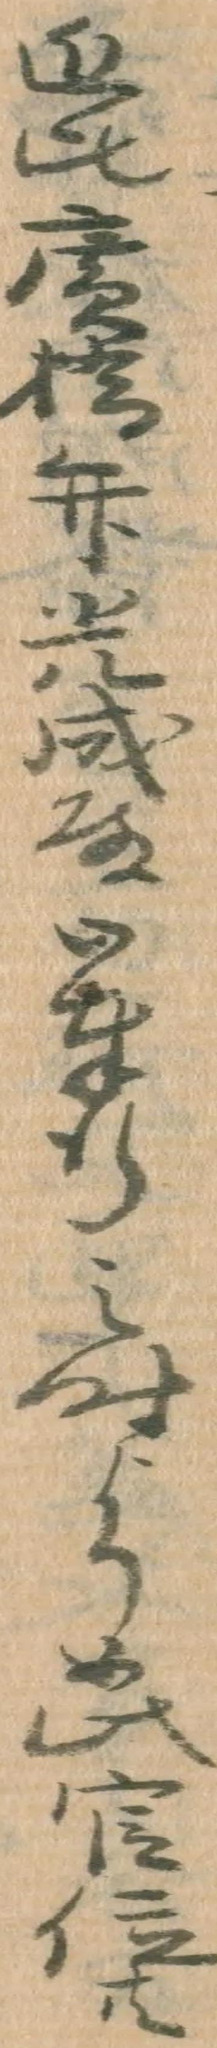近比、広橋弁光成殿御奉行之時より如此官位共
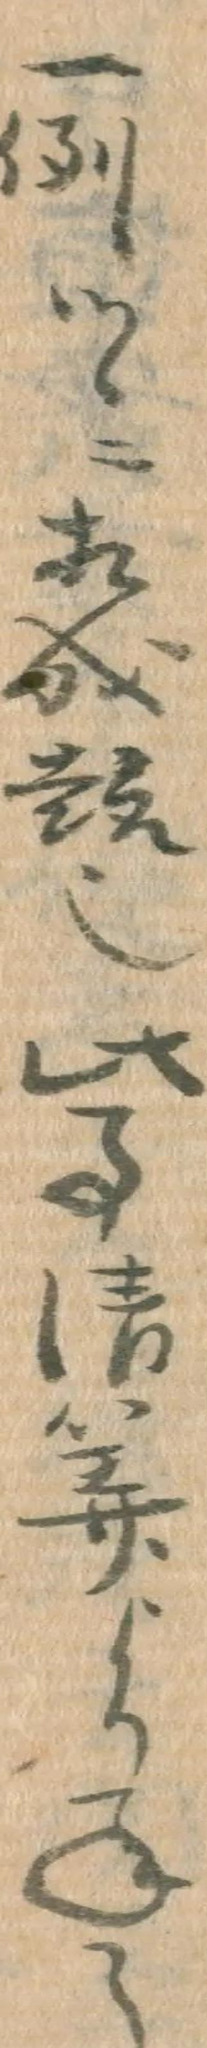一例ツヽニ相成趣也、此事清算より承了、
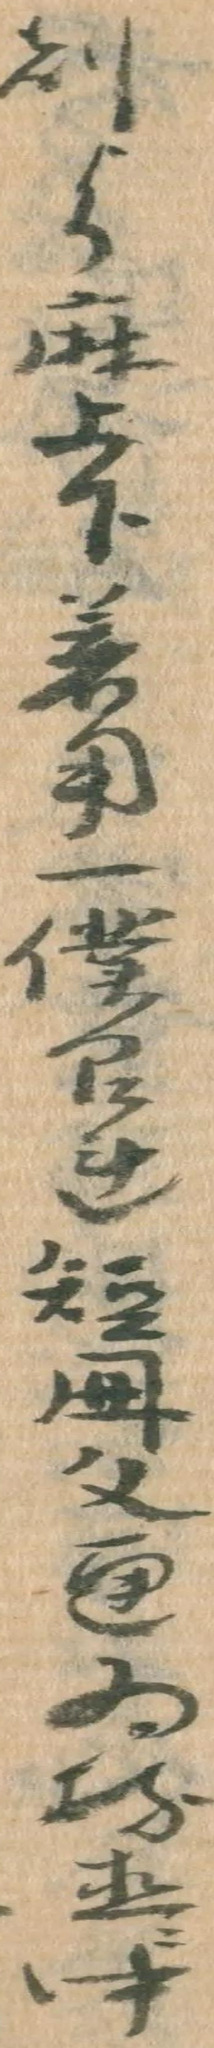刻より麻上下着用、一僕召連短冊久匣為持直に中
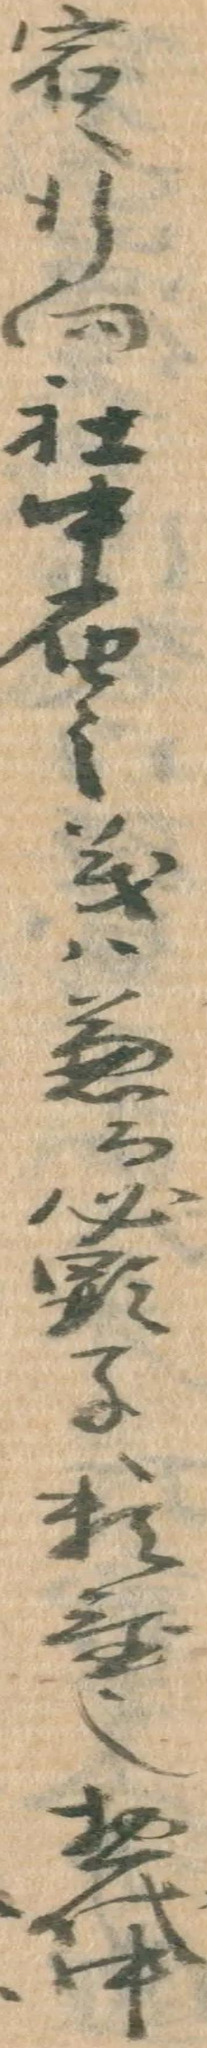宿へ行向、社中届之義ハ、兼而必顕子へ頼置也、惣代中
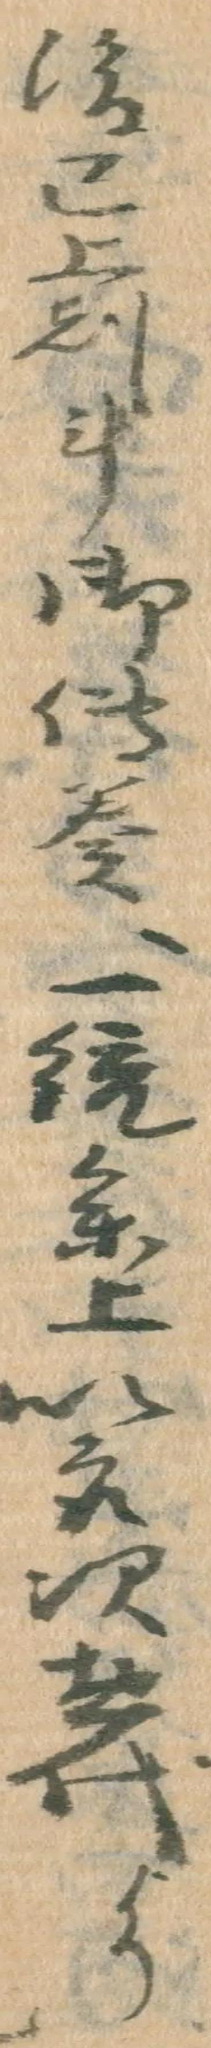後、巳上刻斗御傳奏へ一統参上、以取次惣代より
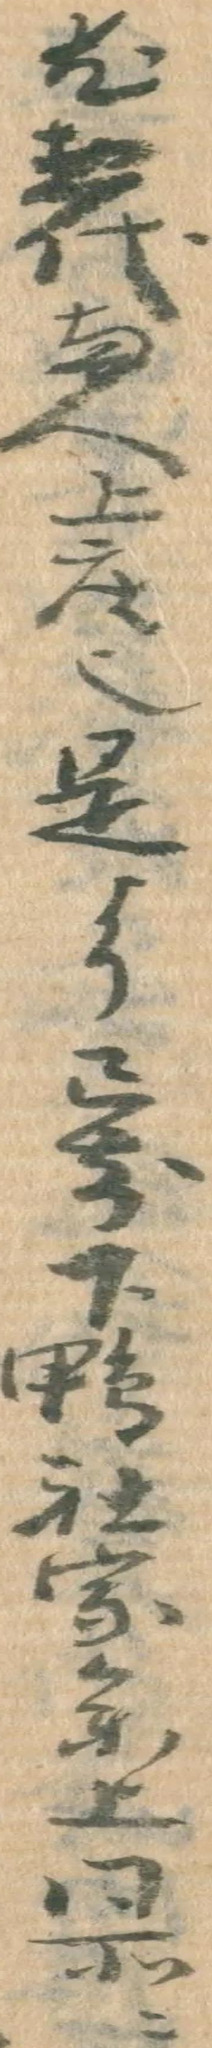尤惣代両人上座也、是より已前、下鴨社家参上、同所に

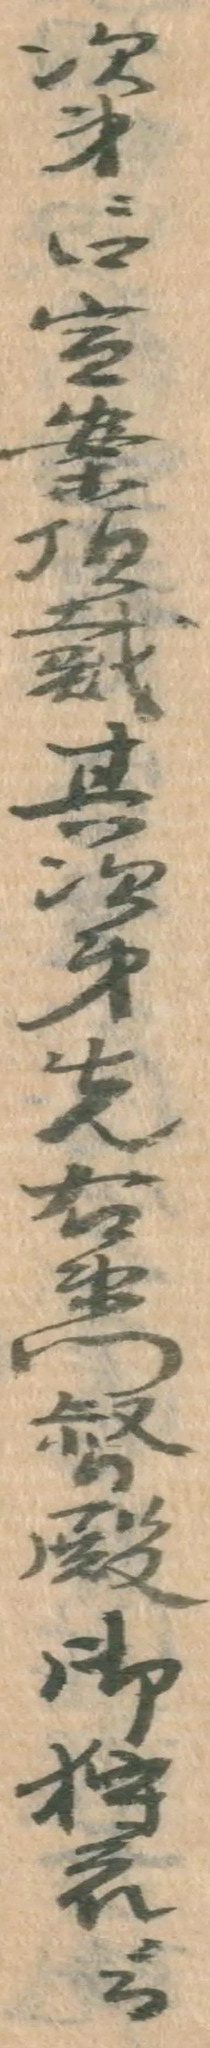次第ニ口宣案頂戴、其次第、先右衛門督殿御狩衣ニ而
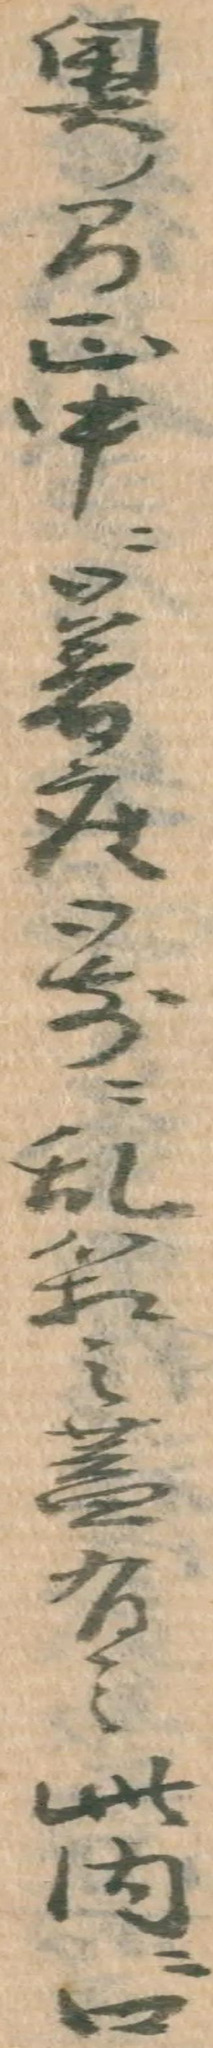奥ノ間正中に御着座、御前ニ乱箱之蓋有之、此内ニ口
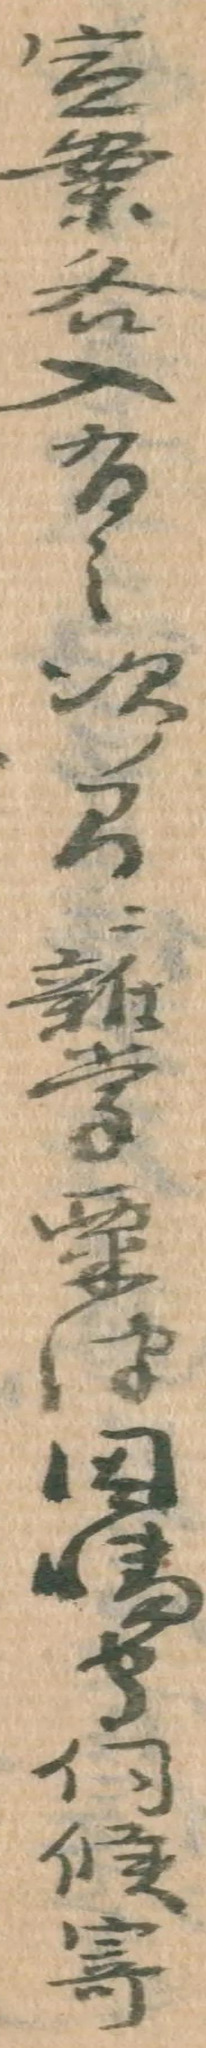定案各入有之、次ノ間ニ雑掌粟津因幡守伺候、寄
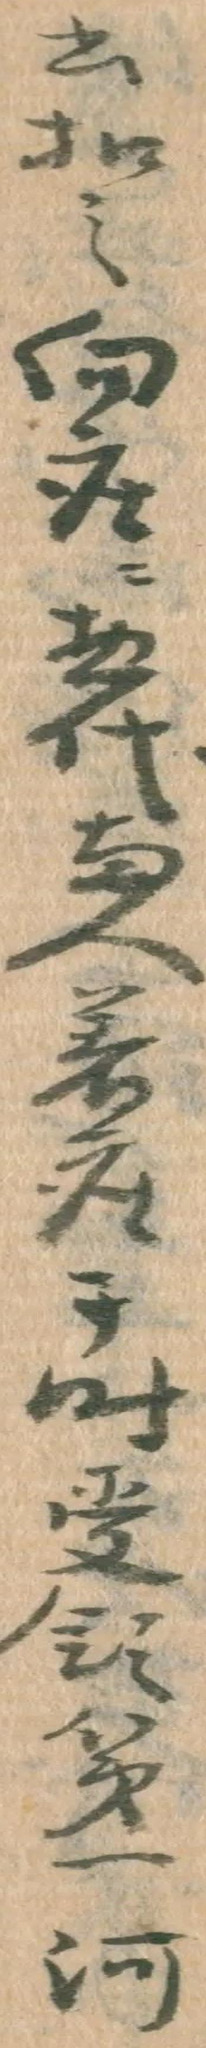書納之、向座ニ惣代両人着座、于時受領、第一河
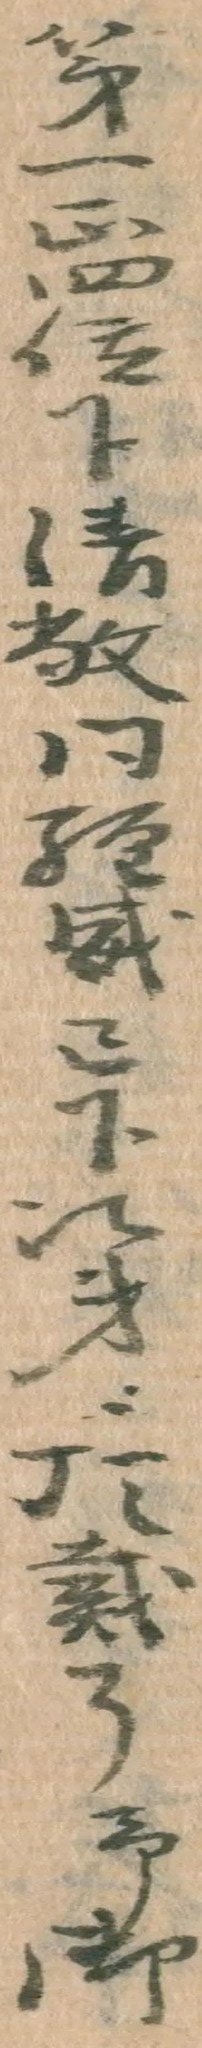第一正四位下清敬、同経威、已下次第に頂戴了、予御
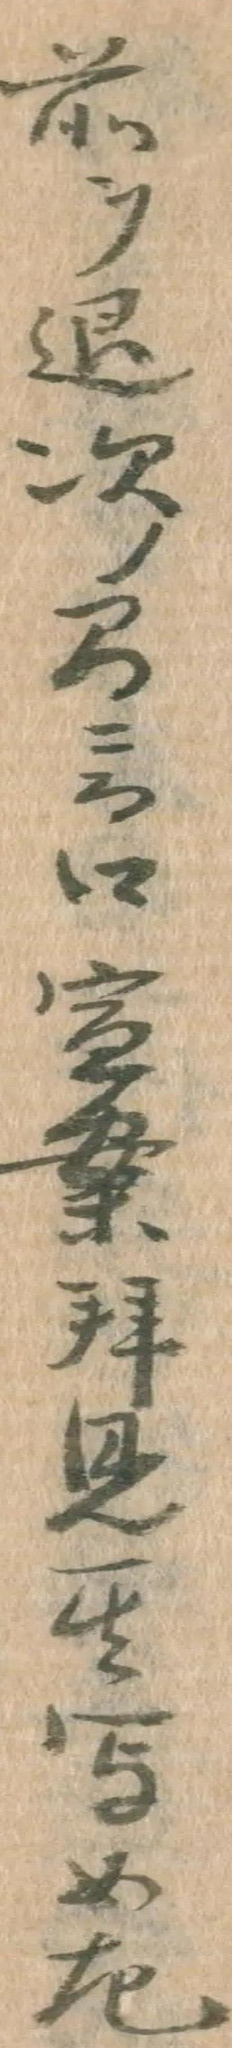前ヲ退次ノ間ニ而口宣案拝見、其写如左、
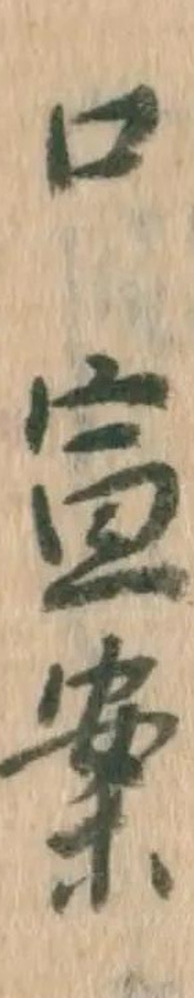口宣案
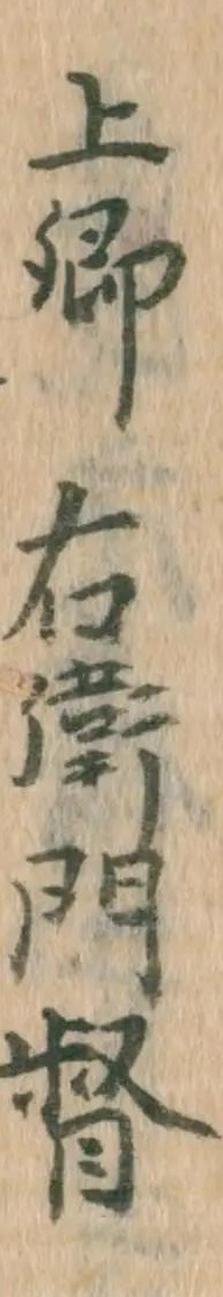上卿右衛門督
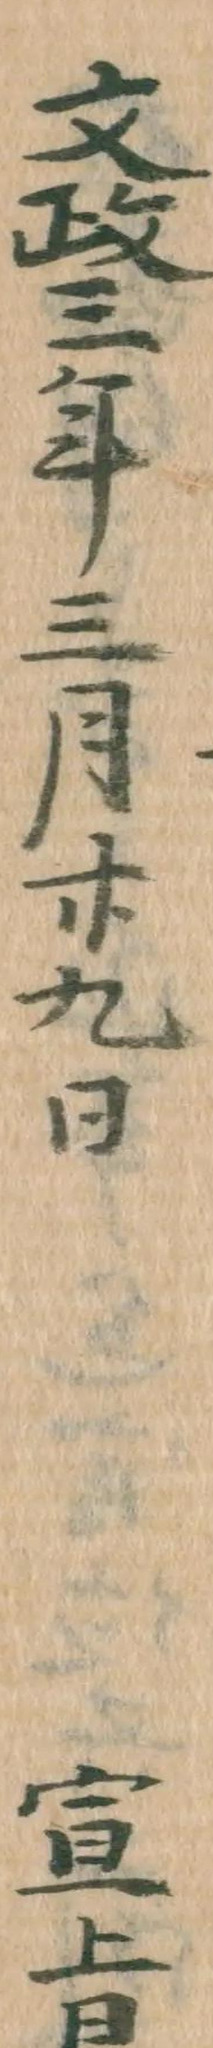文政三年三月廿九日宣旨
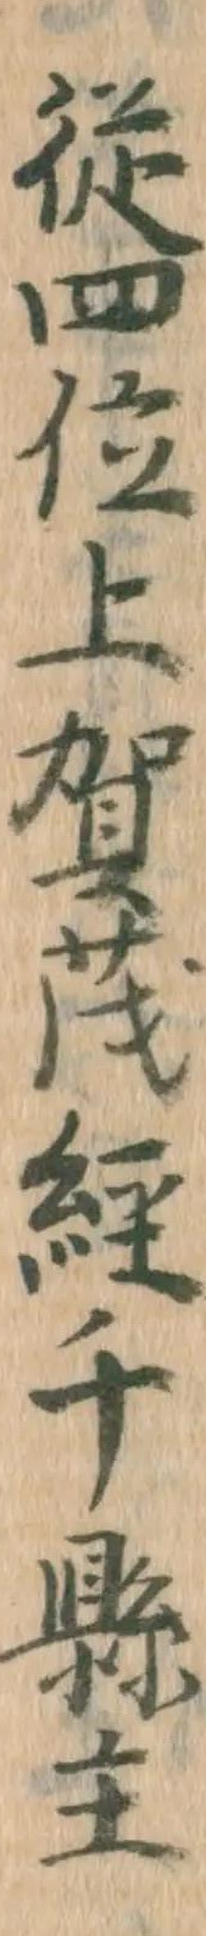従四位上賀茂経千縣主
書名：賀茂社記録. 第63冊
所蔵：国立国会図書館 National Diet Library, JAPAN
